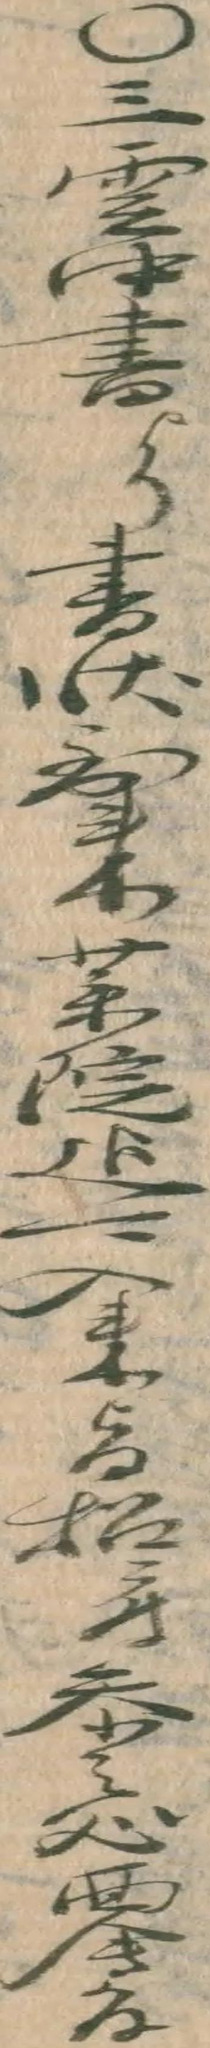○三雲中書より書状到来薬院迄可入来旨招ニ付参之処面會有
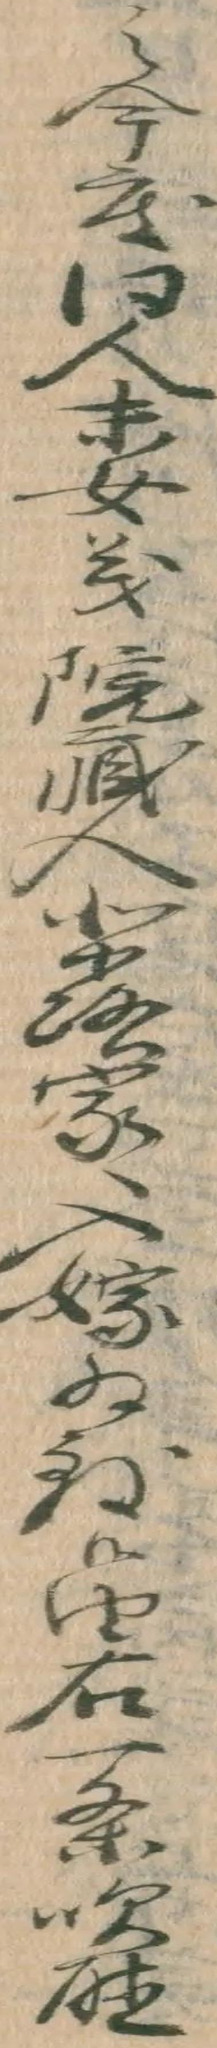之今度同人末女義院蔵北小路家へ入嫁為致候由右一条吹聴
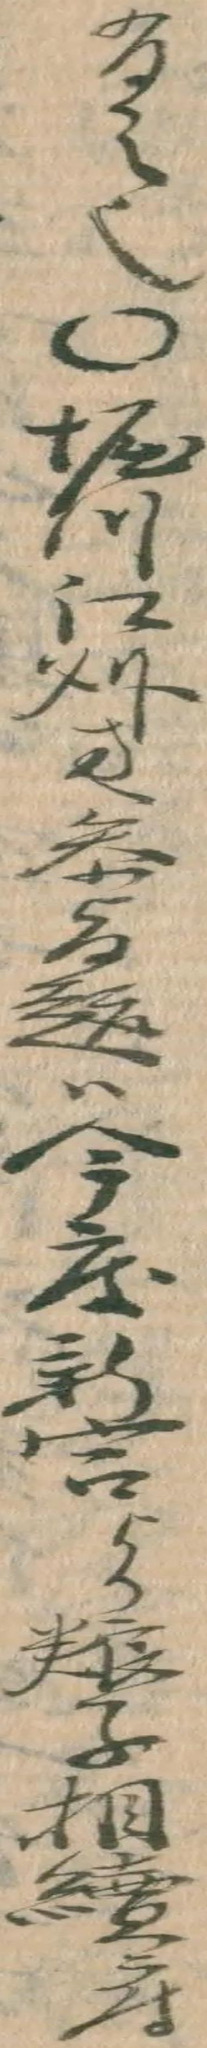有之也○堀川江州方へ参旨趣ハ今度新宮より養子相続ニ付
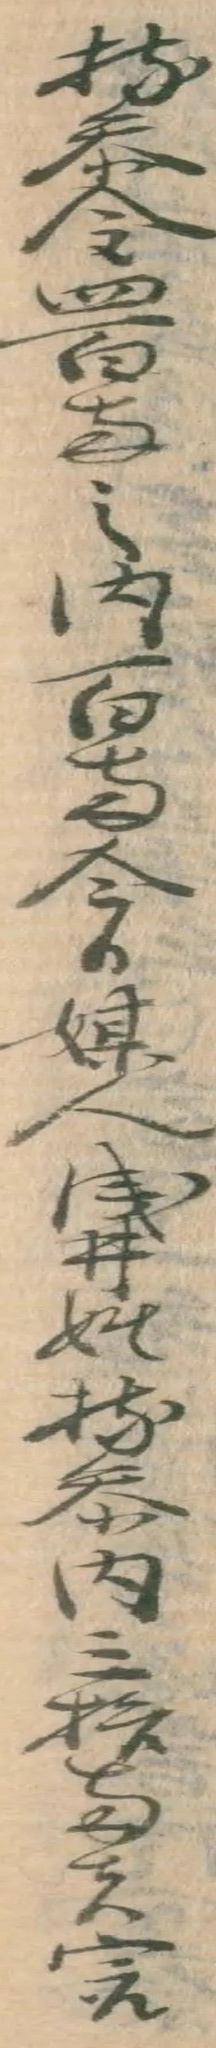持参金四百両之内百両今日媒人浅井姓持参内三拾両者最
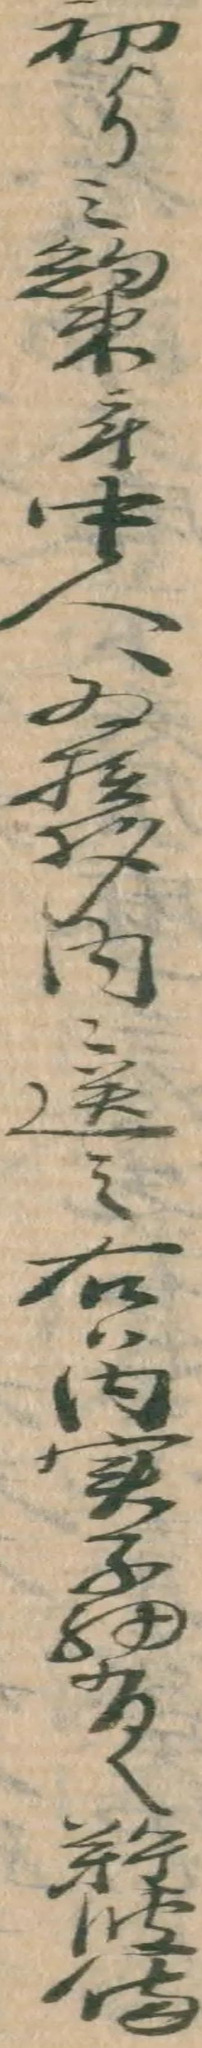初より之約束ニ付中人へ為挨拶内々送之右は内実子細有之難波備
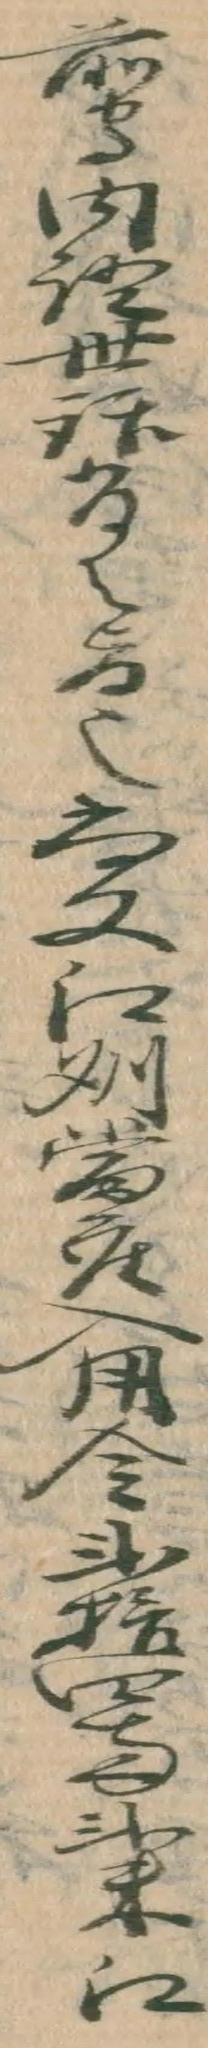前守内證世話有之旨也尚又江州當座入用金弐拾四両弐朱江
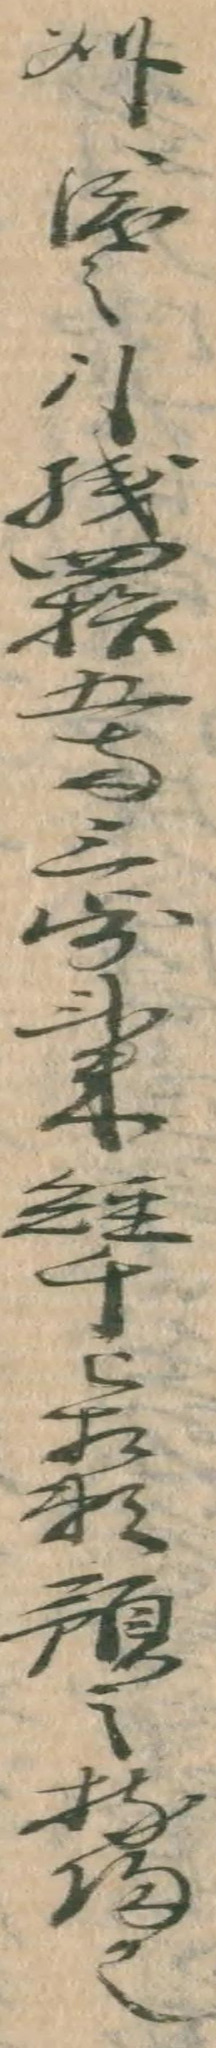州へ渡之引残四拾五両三歩弐朱経千被相頼預之持帰之
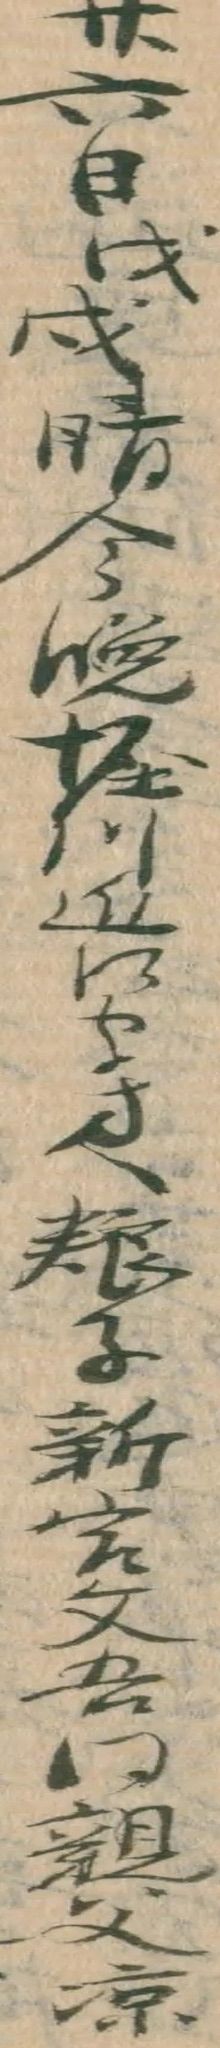廿六日戊戌晴今晩堀川近江守方へ養子新官文吾同親父涼
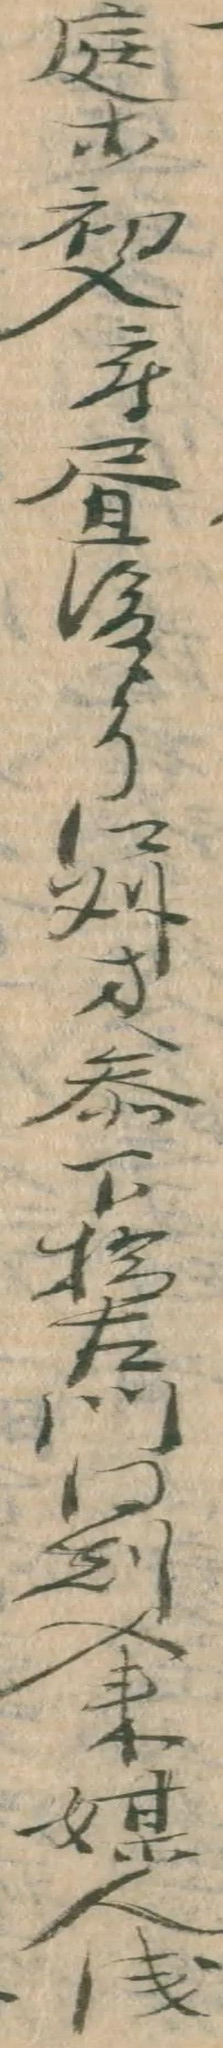庭等初入ニ付昼後より江州方へ参下橋左門同刻入来媒人浅
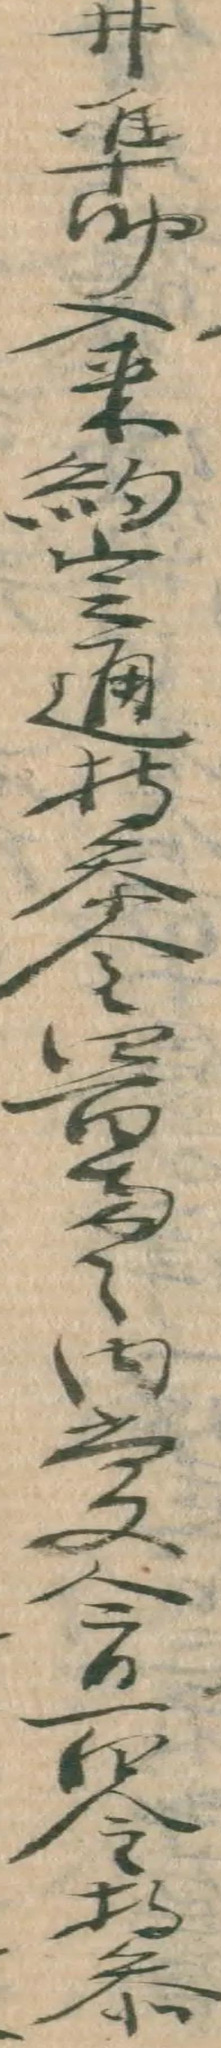井準助入来約定通持参金四百両之内尚又今日百金持参
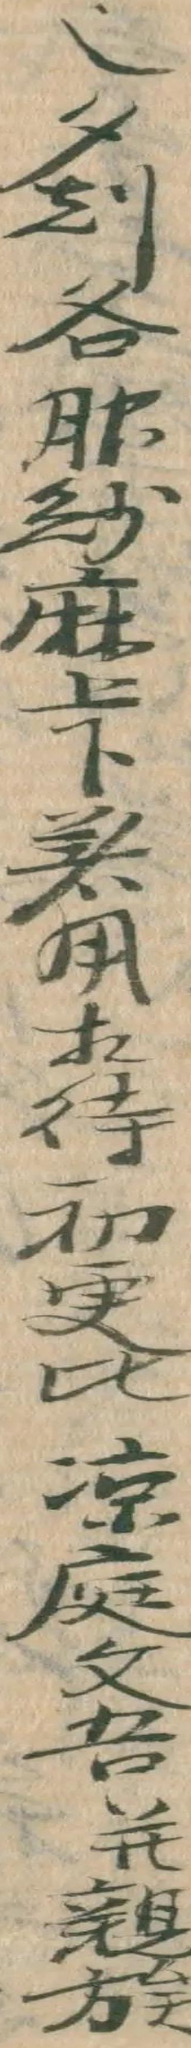也夕刻各服紗麻上下着用相待初更比涼庭文吾并親族
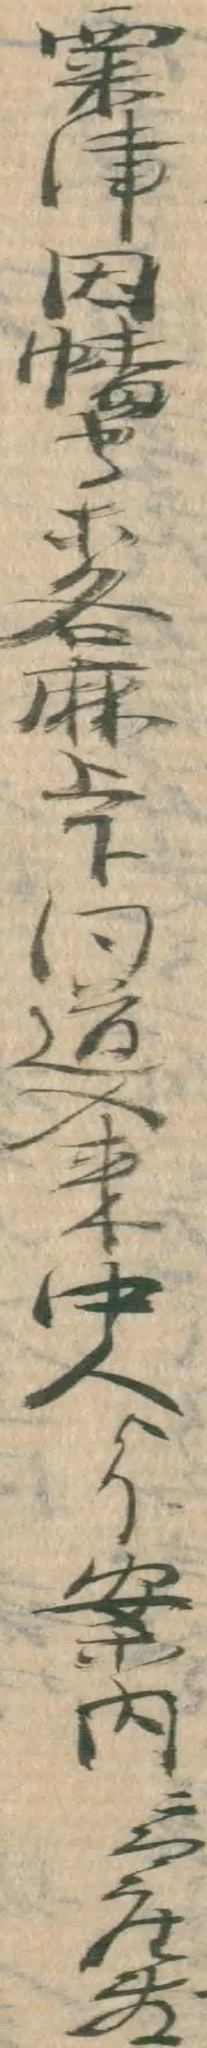粟津因幡守各麻上下向道入来中人より案内にて座敷
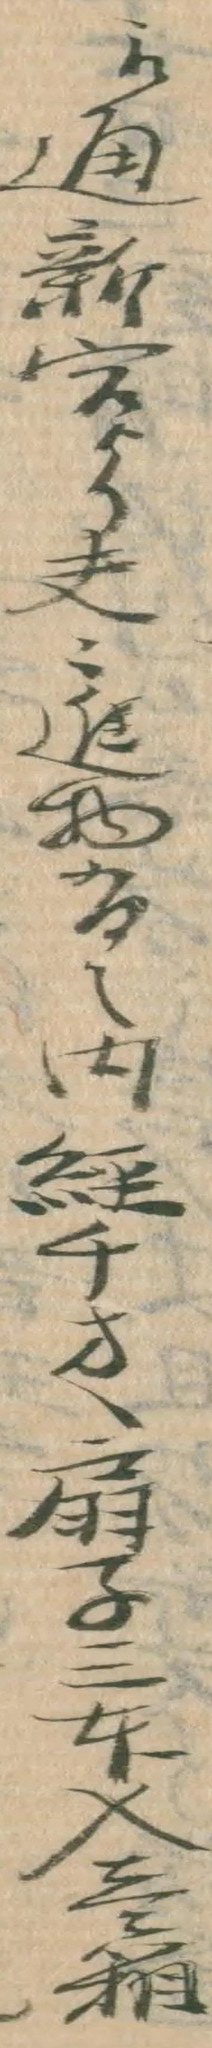え通新宮より夫々進物有之内経千方へ扇子三本入壱箱
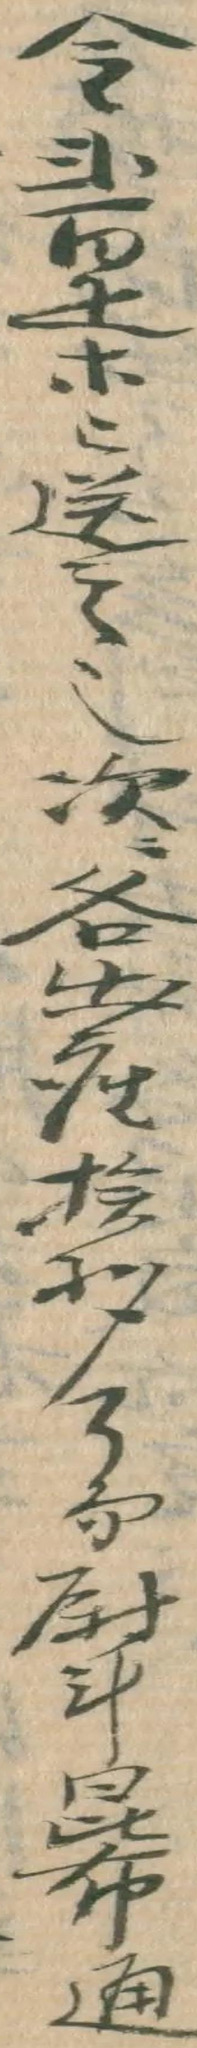金弐百疋等被送之也次ニ各出座挨拶了而尉斗昆布通
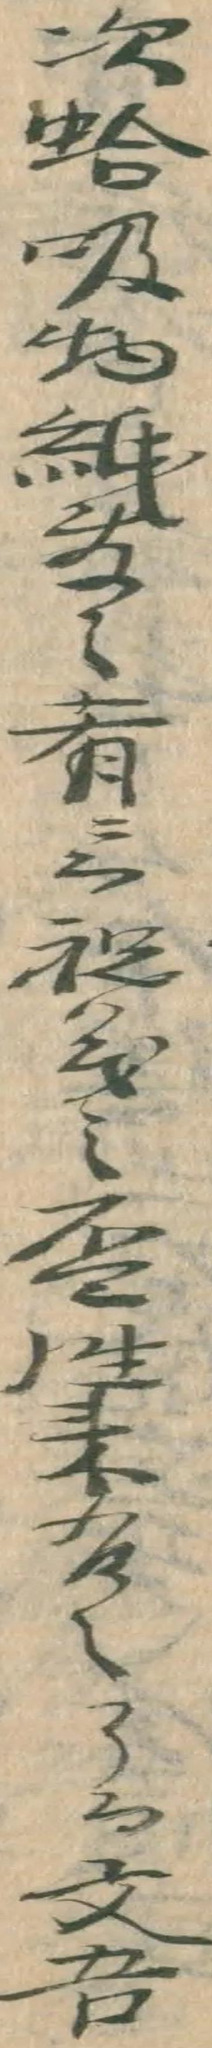次蛤吸物紙敷之肴ニ而祝義之盃往来有之了而文吾
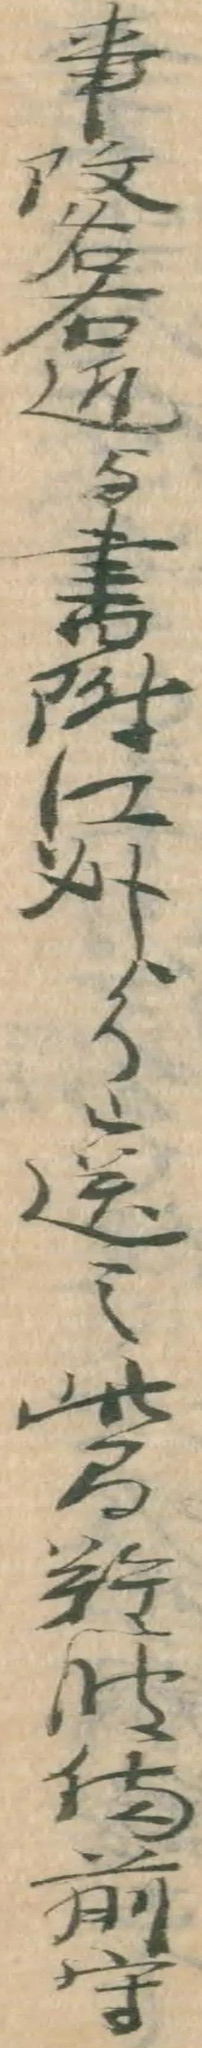事改名右近と書附江州より被送之此間難波備前守
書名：賀茂社記録. 第65冊
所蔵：国立国会図書館 National Diet Library, JAPAN
